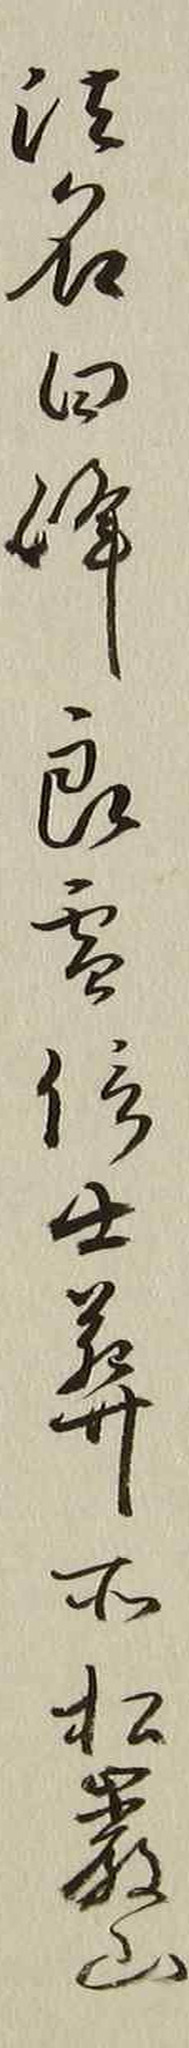法名日峰良雪信士葬所松厳山
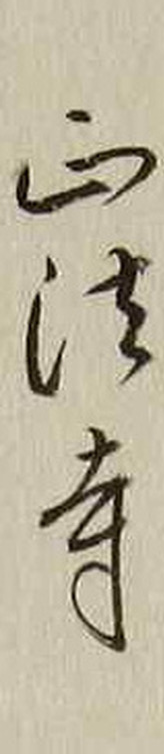正法寺
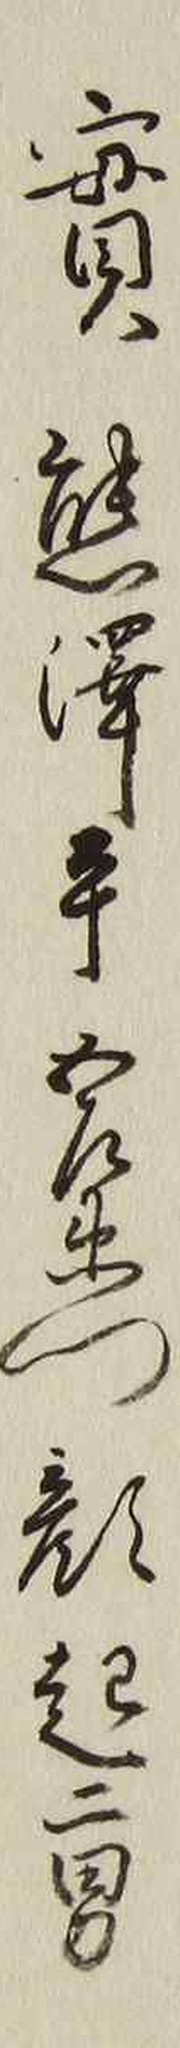実熊澤平五左衛門顔起二男
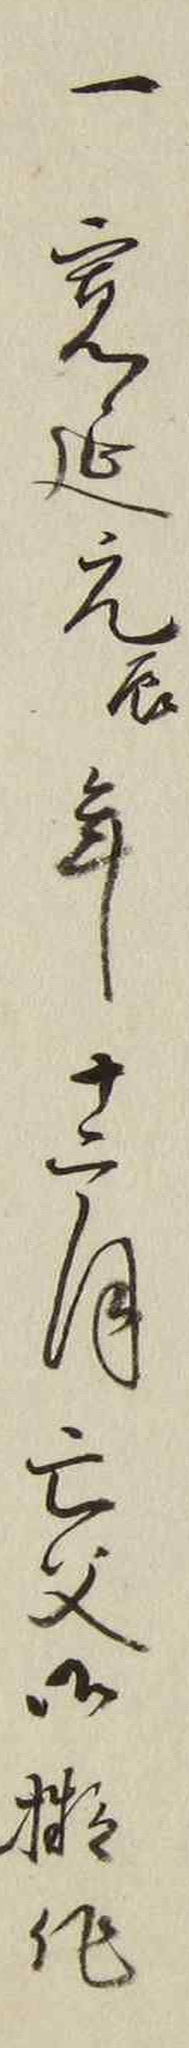一寛延元辰年十二月亡父御擬作

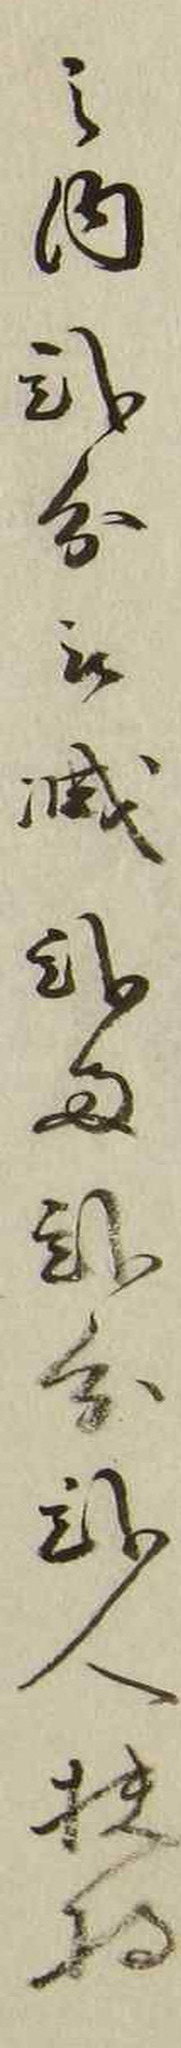之内弐分被減弐両弐分弐人扶持
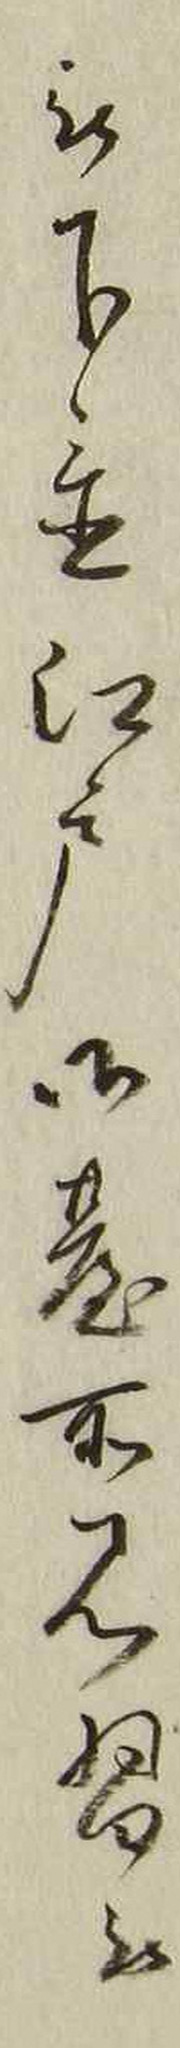被下置江戸御台所見習被
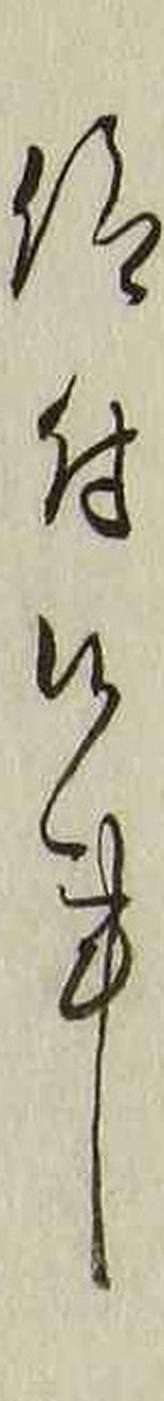仰付候事
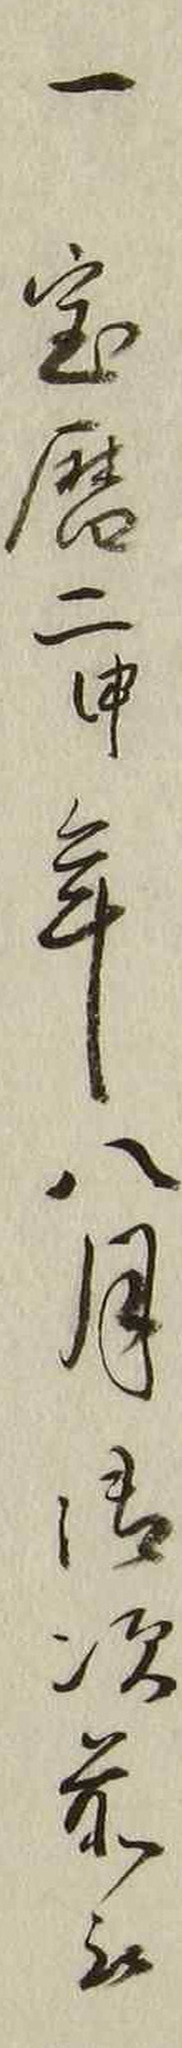一宝暦二申年八月御次前被
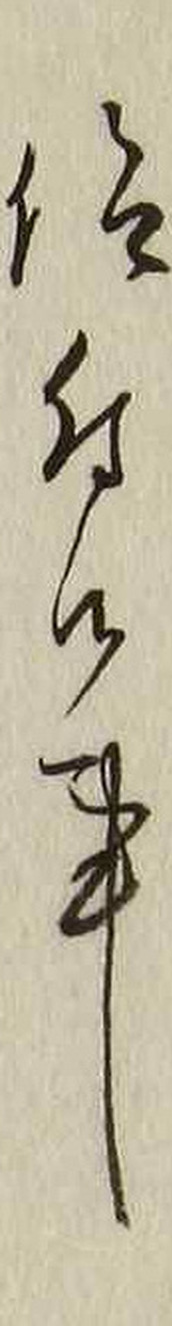仰付候事
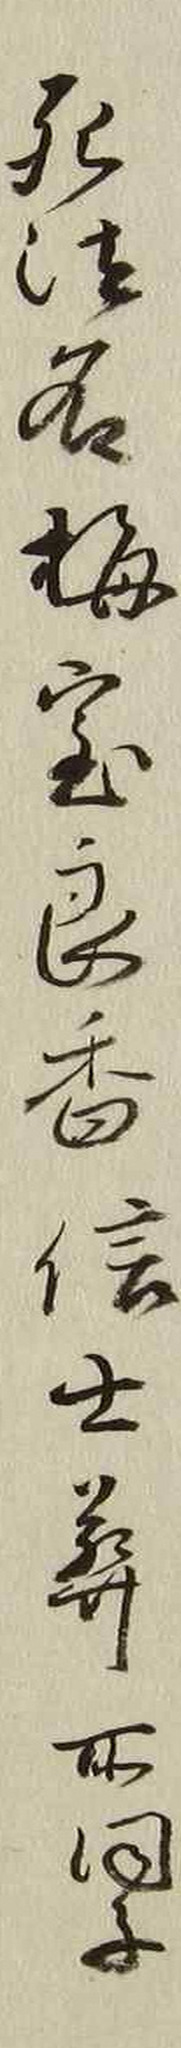死法名梅宝良香信士葬所同子
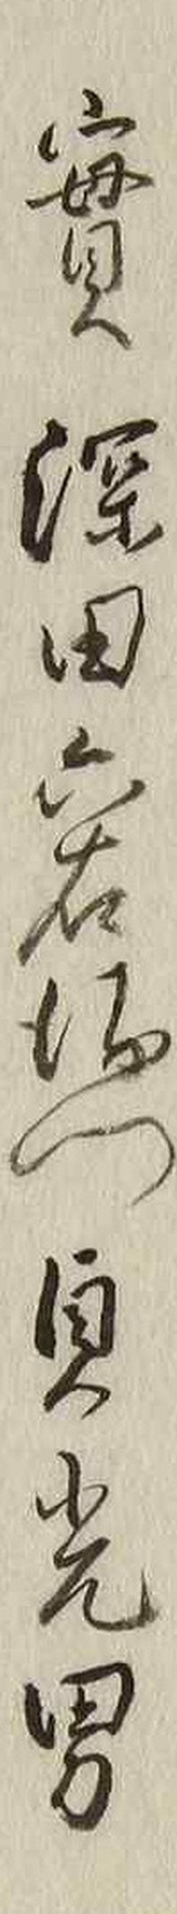実深田六右衛門貞光男
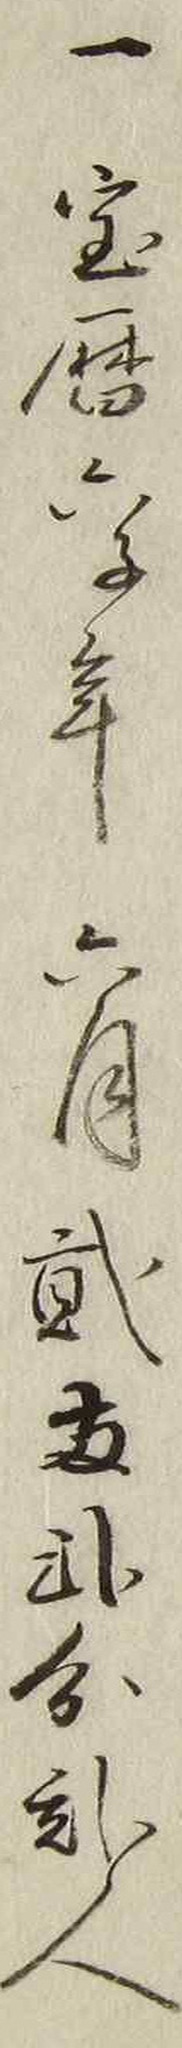一宝暦六子年六月弐両弐分弐人
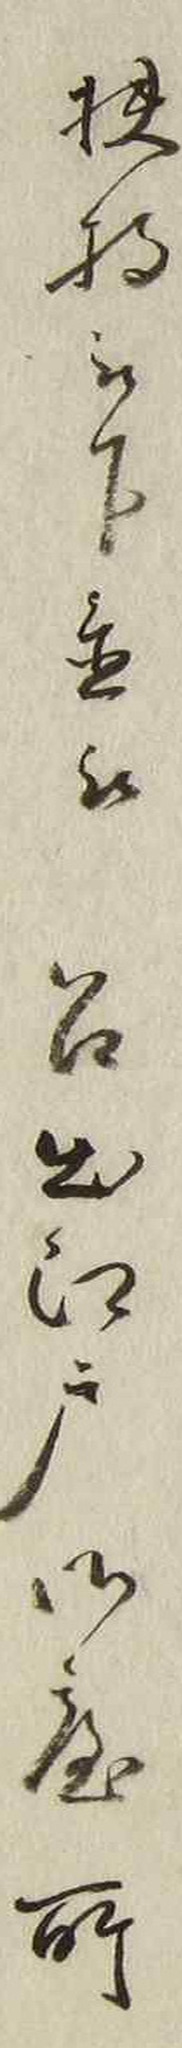扶持被下置被召出江戸御台所
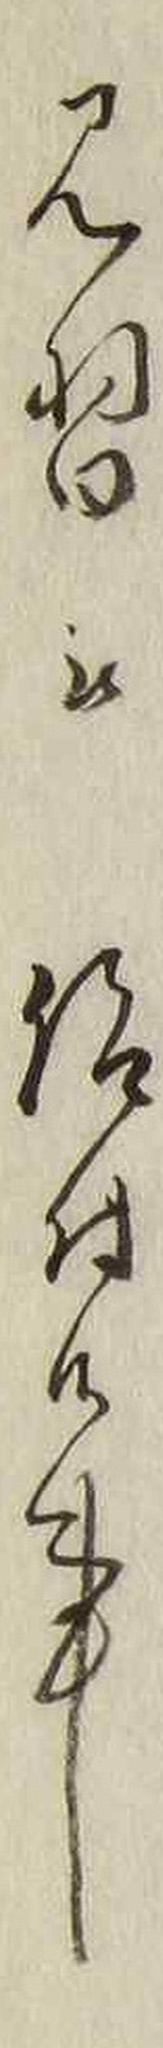見習被仰付候事

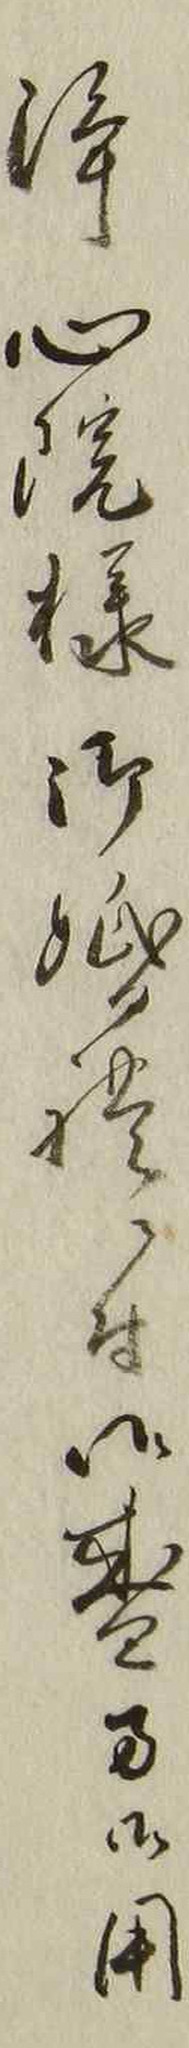浄心院様御婚礼付御盛方御用
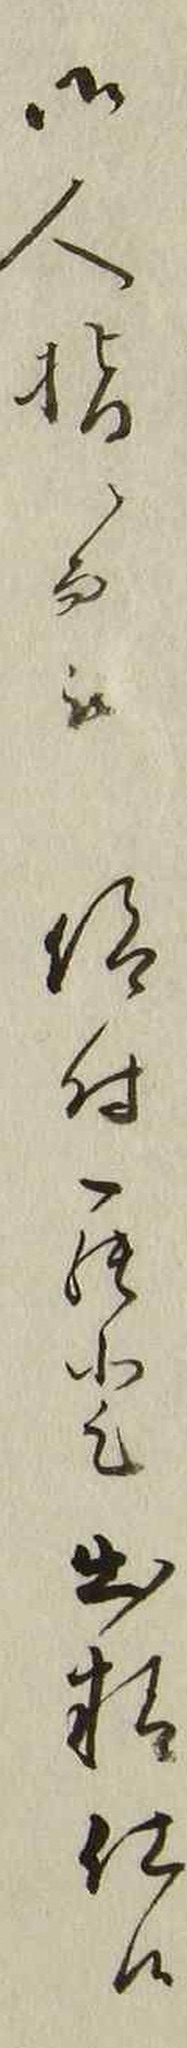御人指ニ而被仰付罷登出精仕候
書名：諸士系譜　巻之10　い之部10
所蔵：会津若松市立会津図書館
